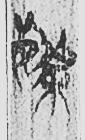殜
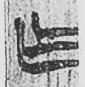乍（作）
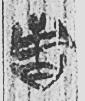周
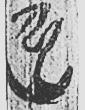{尸山}
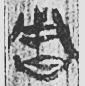周
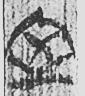室
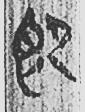即
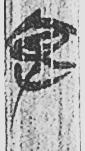{宀卑}
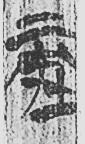坪
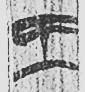王
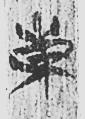東
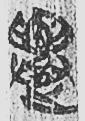{䙴止}
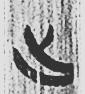止
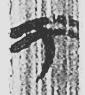于
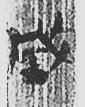成
